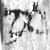卯
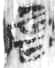晨
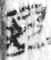是
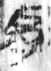胃（謂）
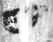日
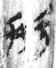利（利）
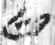㠯（以）
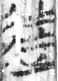○（解）
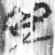兇（凶）
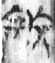○（除）
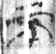不
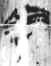羊（祥）
